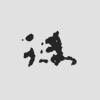路
